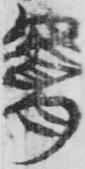膚（盧）
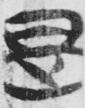是（氏）
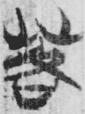茖（赫）
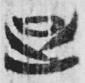疋（胥）
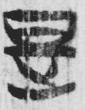是（氏）
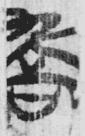喬
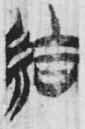結
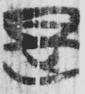是（氏）
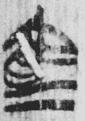結倉
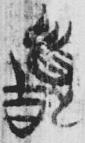頡
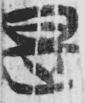是（氏）
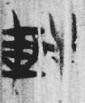軒
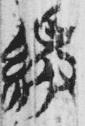緩（轅）
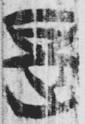是（氏）
